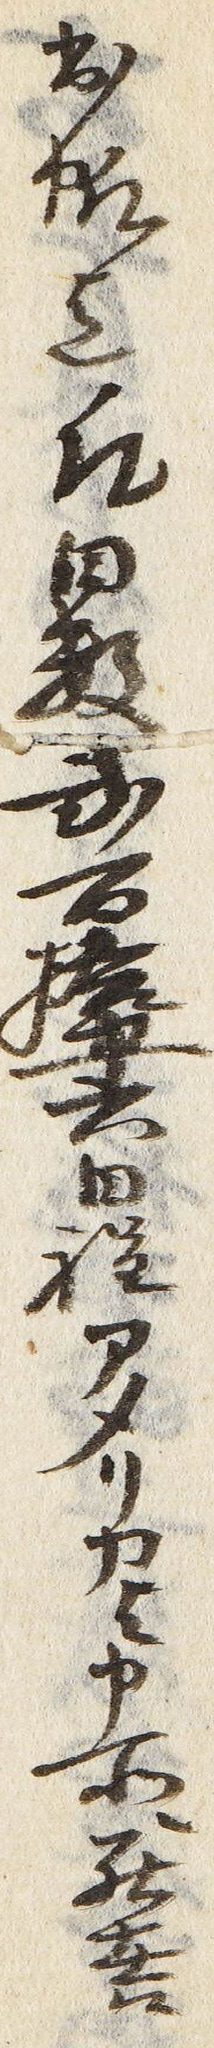出帆迄凡日数弐百拾五六日程アメリカと申所へ罷在候
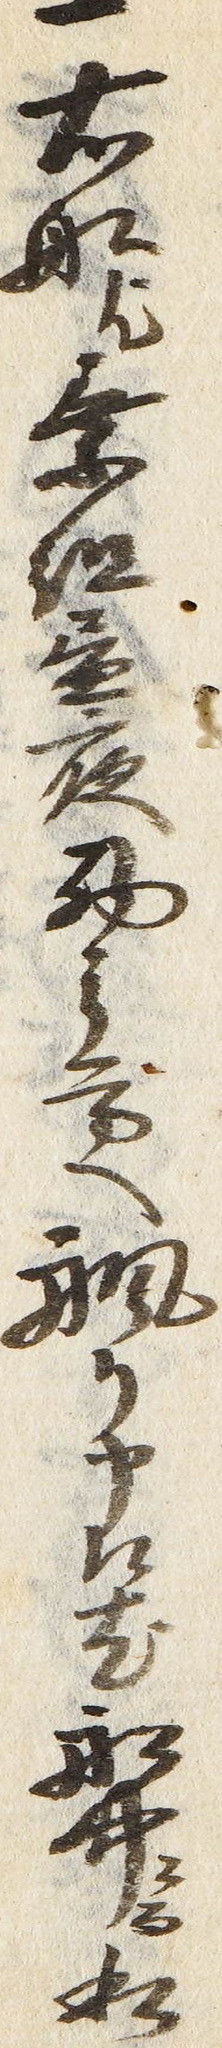一右舩江乗組晝夜西之方へ䑺り申候尤舩中ニ而私
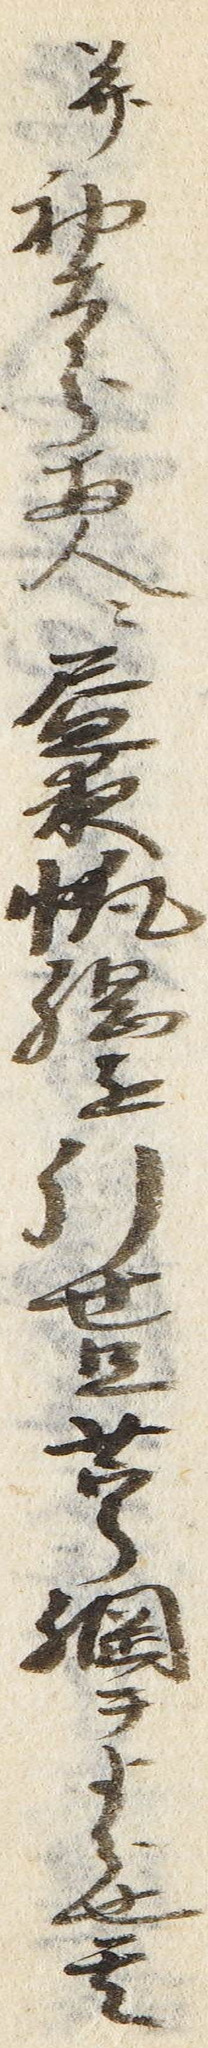幷初太郎両人ニ晝夜帆綱を引せ且苧綱ヲよらせ其
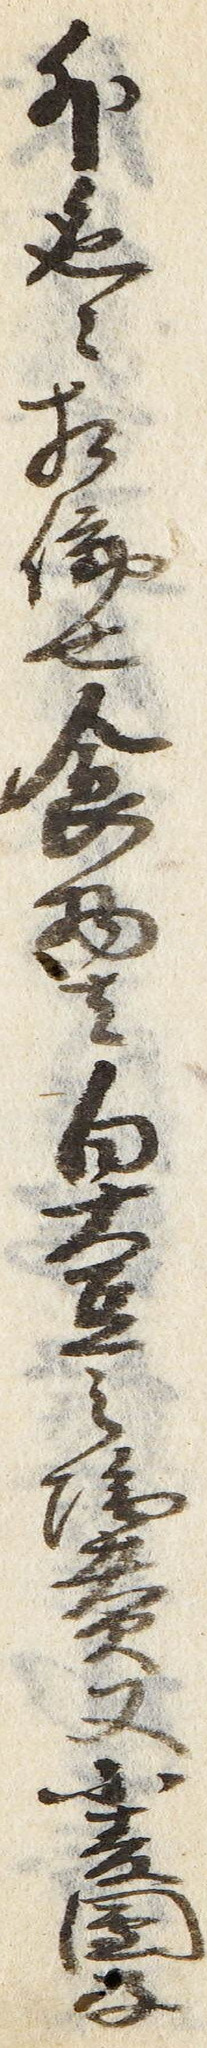外色々相働せ食物者白大豆之塩煑又小麦團子
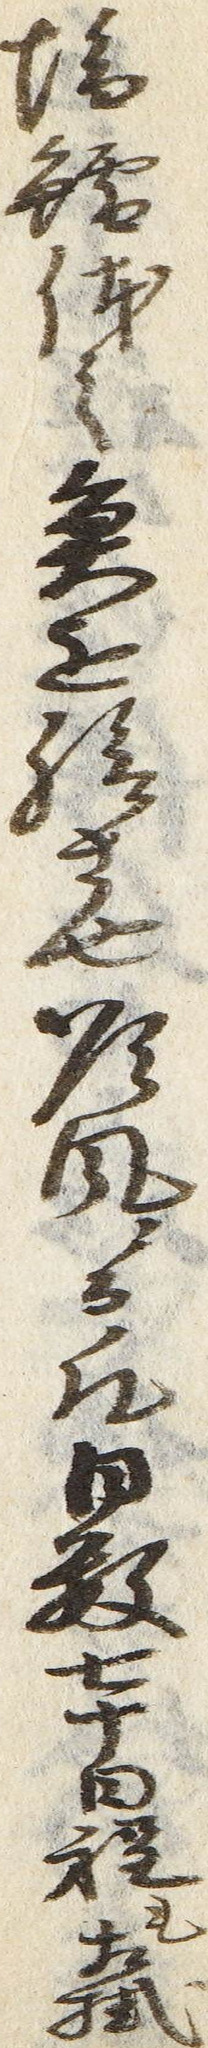塩鱈体之𩵋を給させ順風ニ而凡日数七十日程も相掛
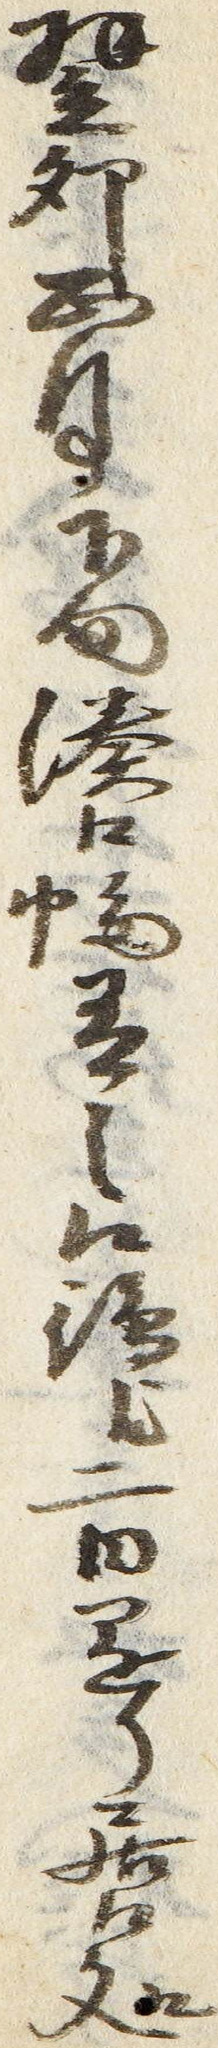翌卯正月下旬湊口幅有之候嶋江二日懸り居候処

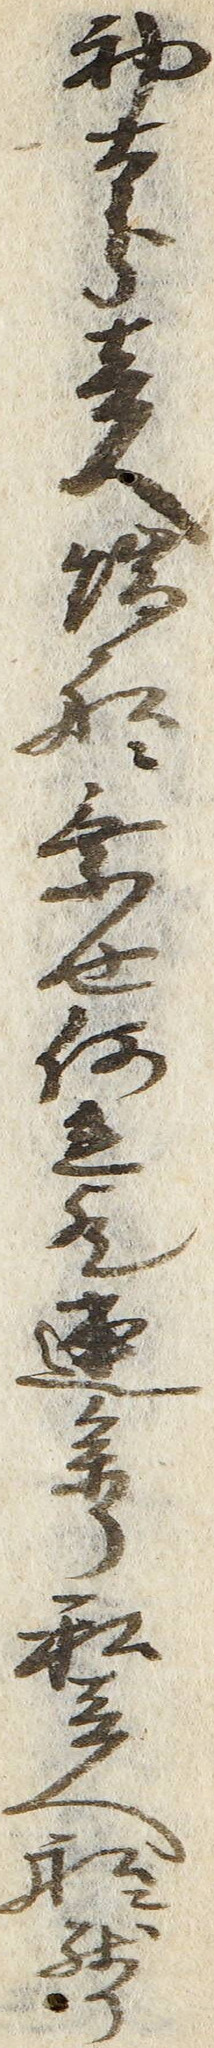初太郎壱人端舩ニ乗せ何れ欤連参り私壱人舩ニ残り
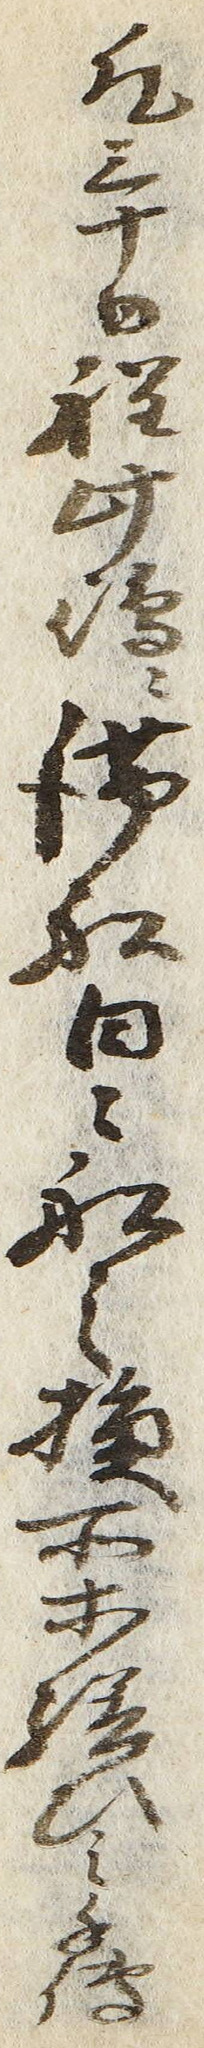凡三十日程此嶋ニ滞舩日々舩之損所相繕ひ之手傳
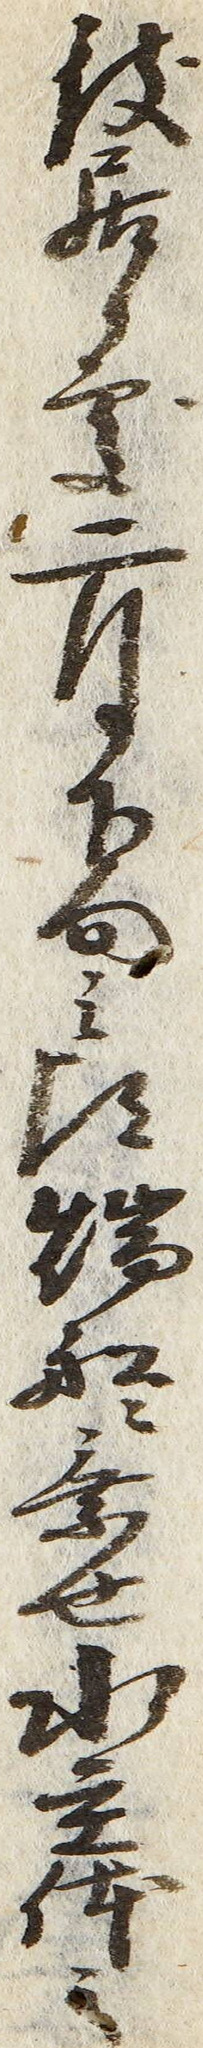致居候處二月下旬之比端舩ニ乗せ水主体之
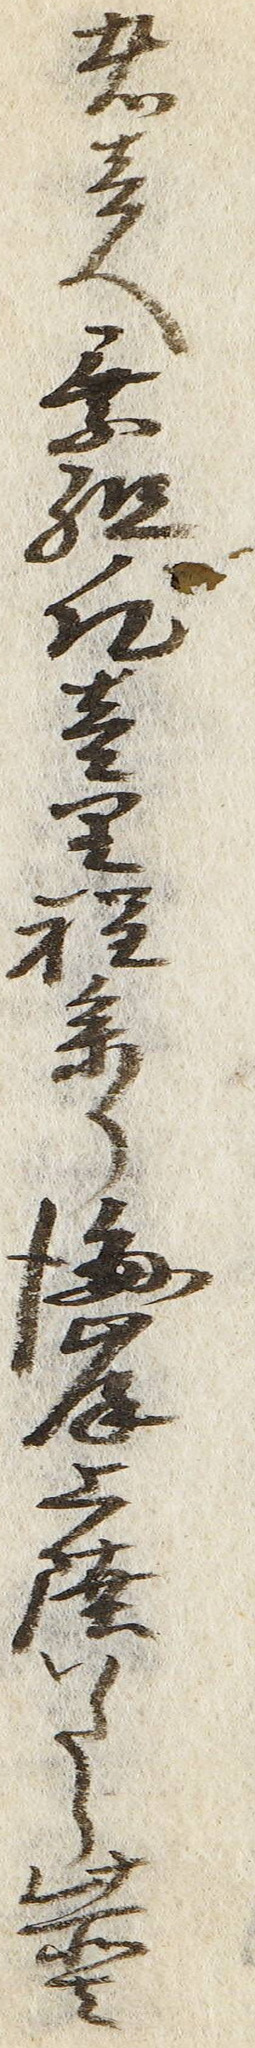者壱人乗組凡壱里程参り海岸上陸いたし此所者
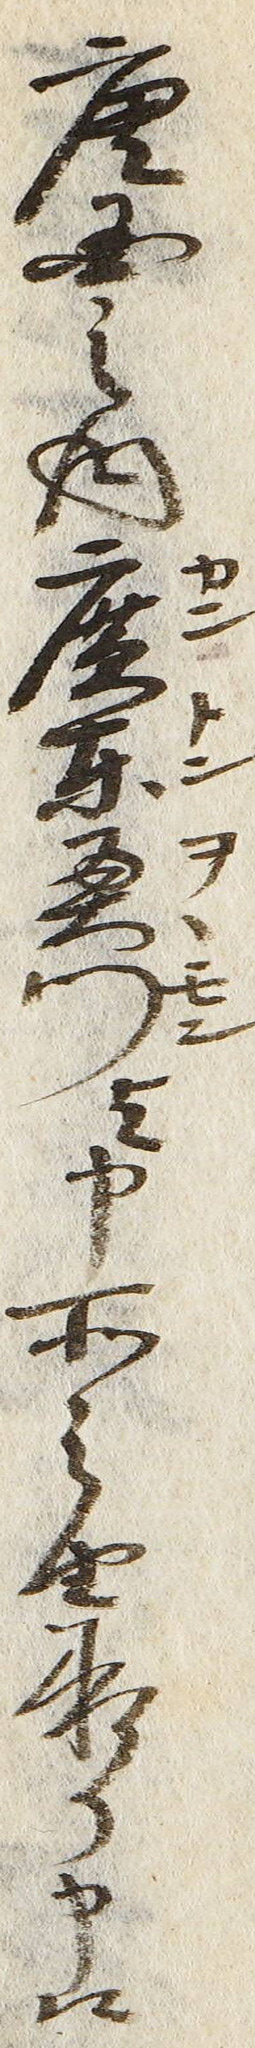唐国之内廣東奥門と申所之由承り申候
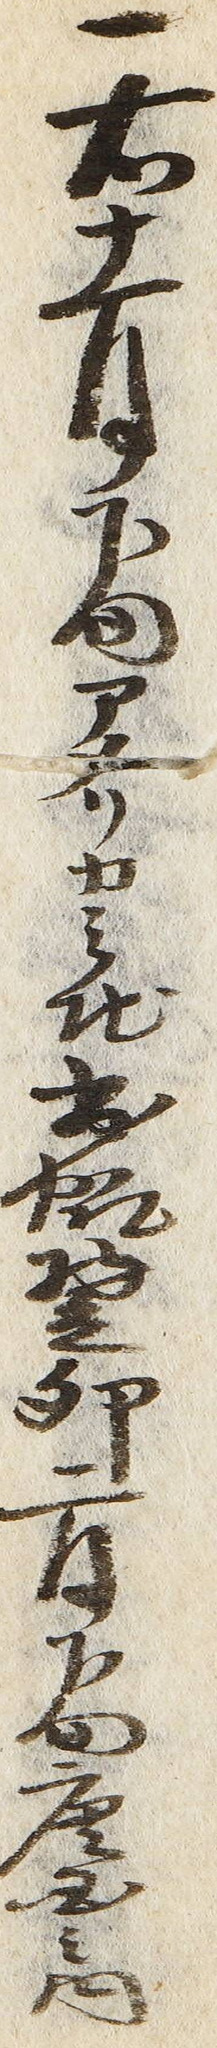一右十一月下旬アメリカ之地出帆翌卯二月下旬唐国之内
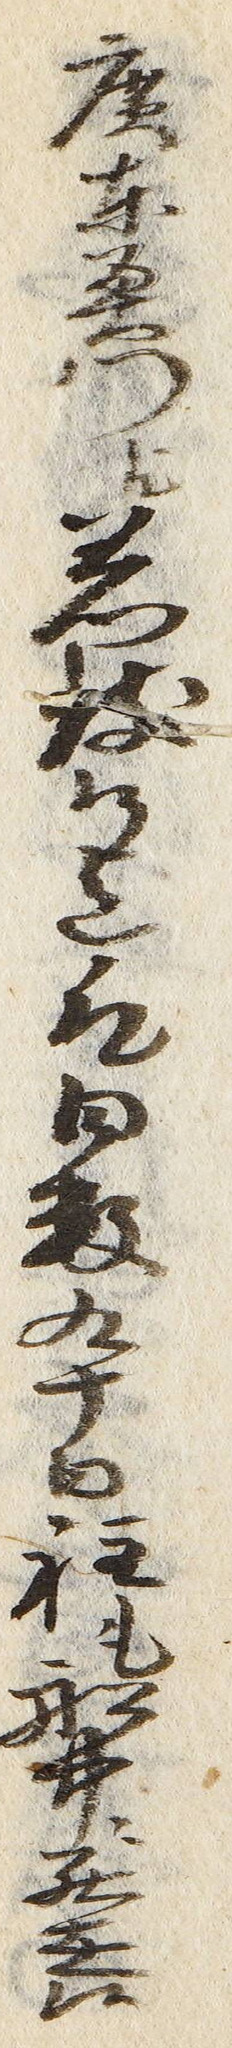廣東奥門江着致候迄凡日数九十日程も舩中ニ罷在候
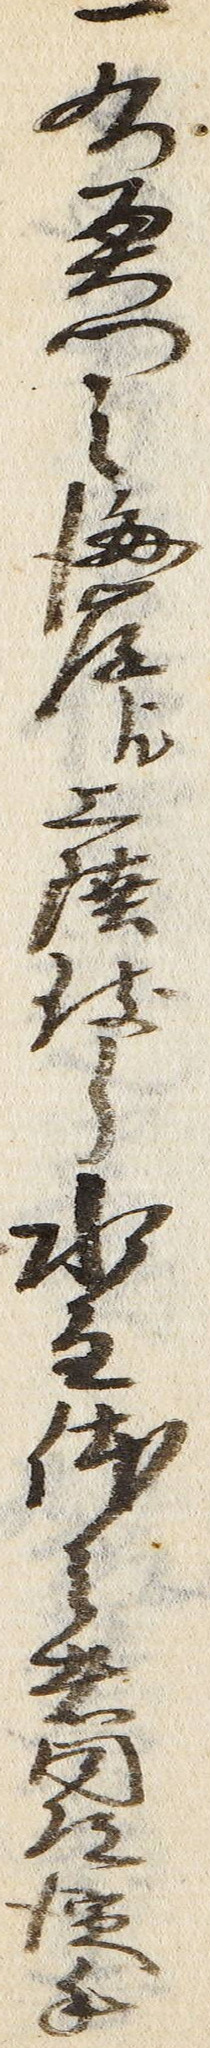一右奥門之海岸江上陸致し水主体之者同道濱手
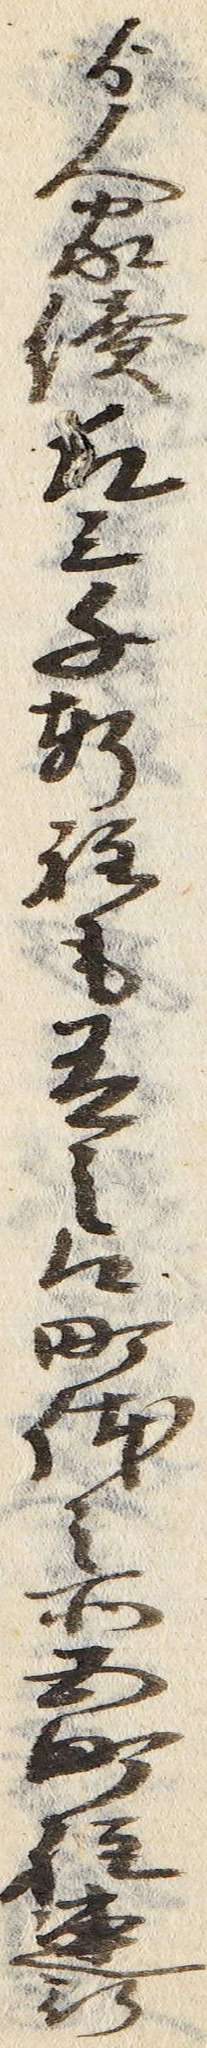ゟ人家續凡三千軒程も有之候町体之所五町程連行
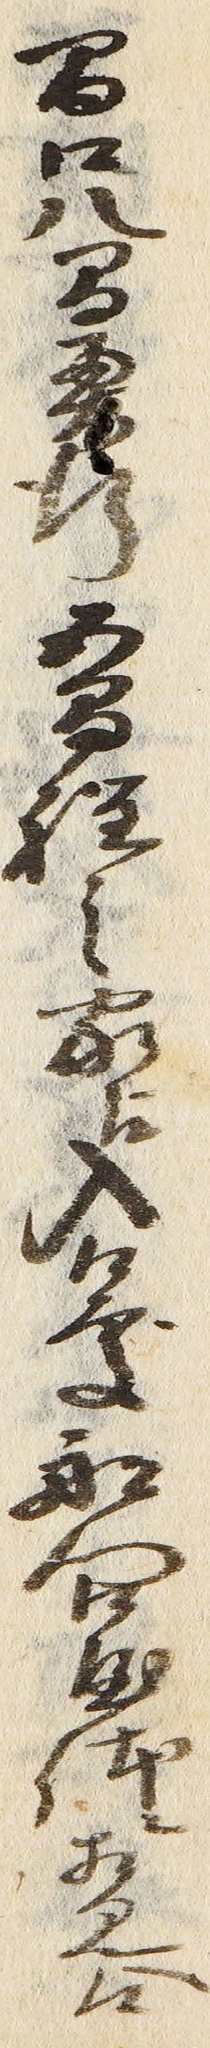間口八間奥行五間程之家江入候處舩問屋体ニ相見へ候
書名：漂流人善助聞書
